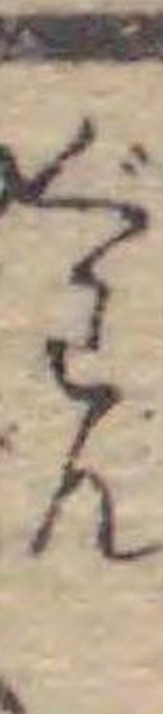ぐわん
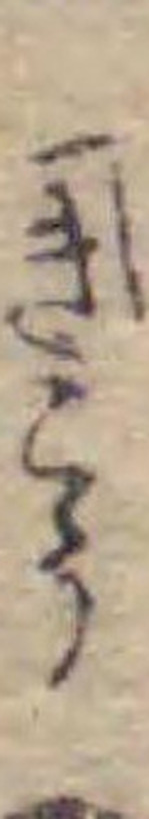〽きこう
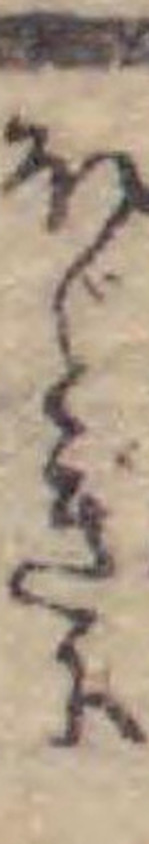ほどきに
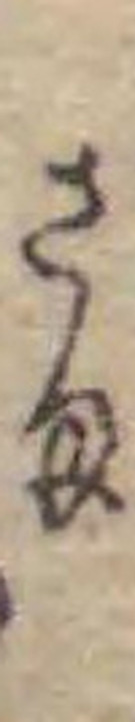さまも
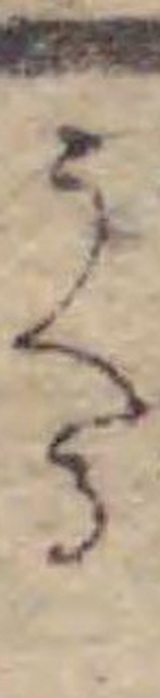うへる
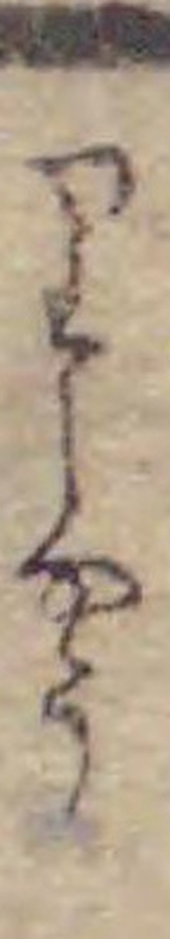りしやう
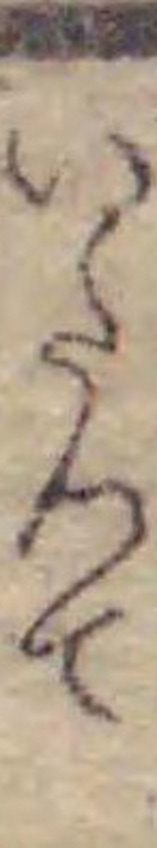いたつて
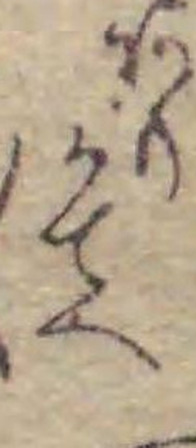かてへ

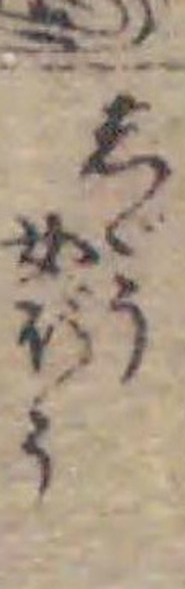女ぼう
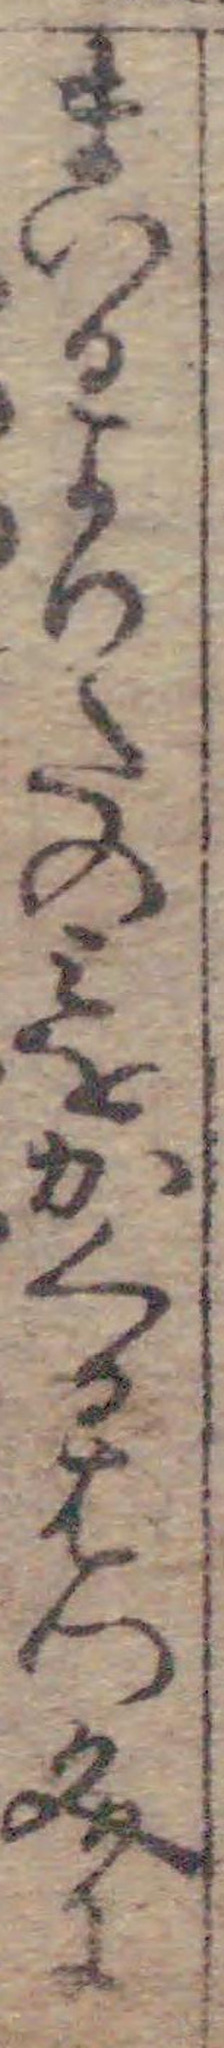まいるよりたのみをかくるはつ文に
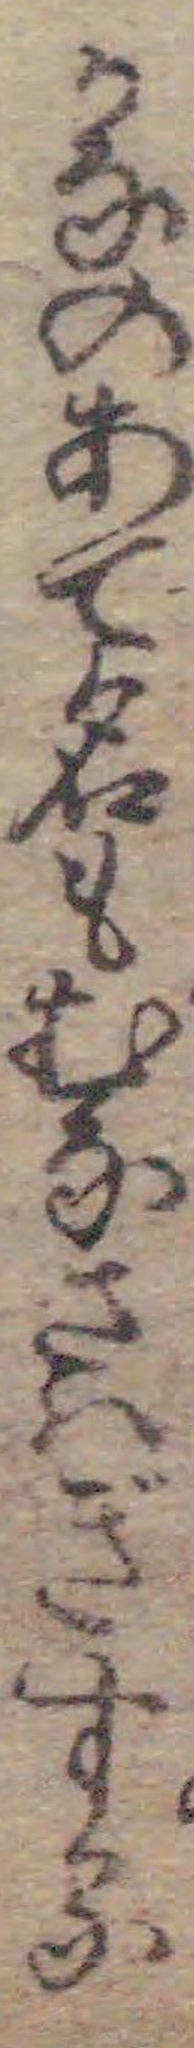かなのあて名もむなさはぎする
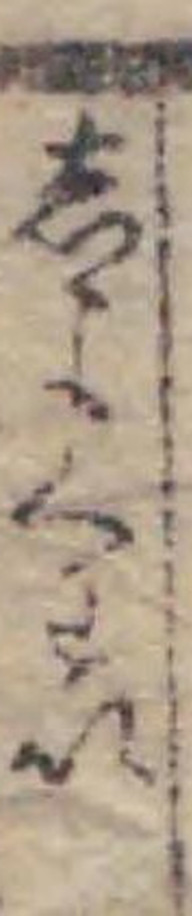しよくわい
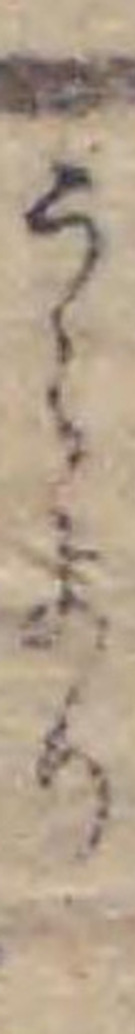うらより
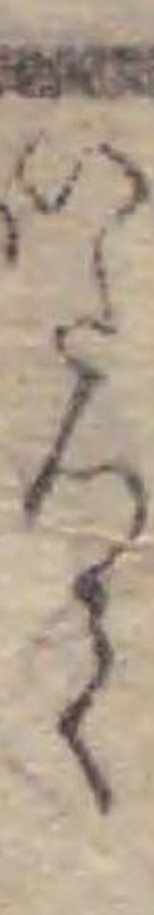いたつて
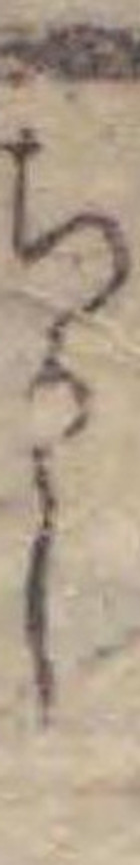ちかし
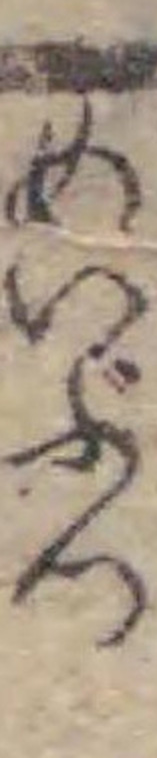めいぶつ
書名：北国順礼唄方便 : 3巻
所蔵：国立国会図書館 National Diet Library, JAPAN
